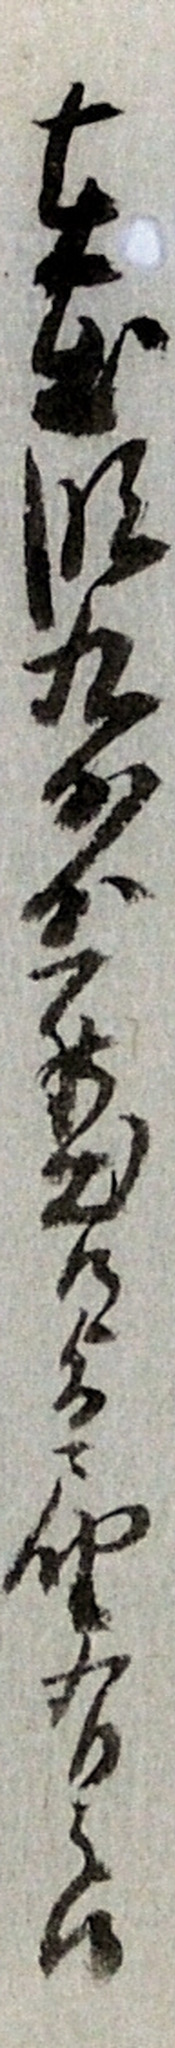在出明九日ゟ罷出候旨届有之候
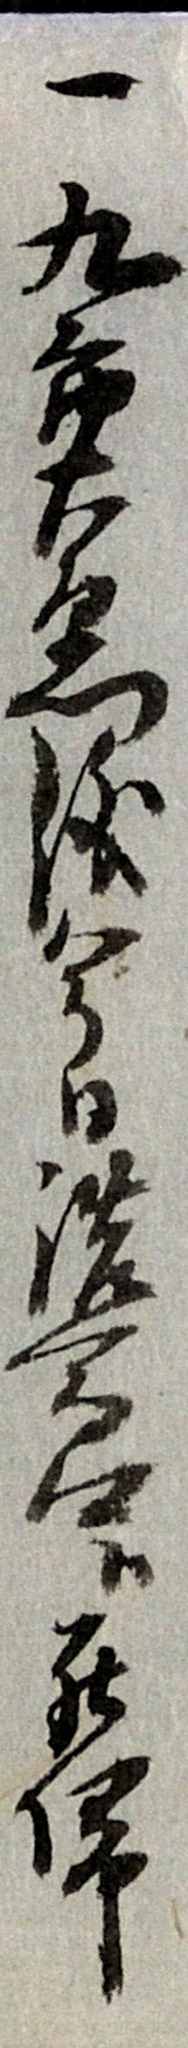一九郎右衛門儀今日洗馬郷江罷帰
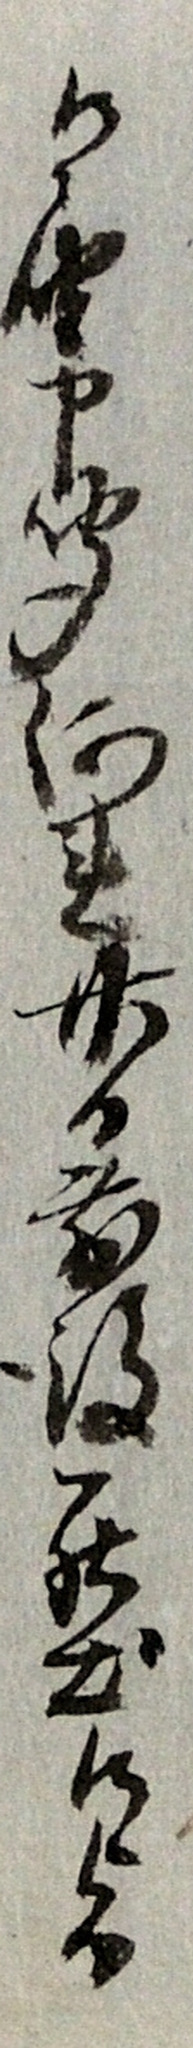候届申聞何れ廿日前後罷出候旨
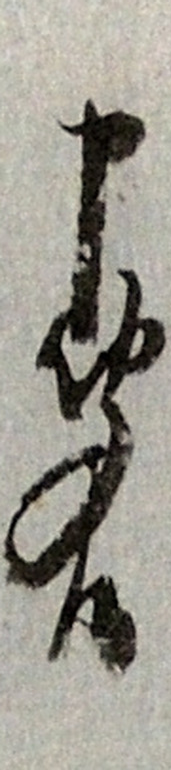申聞候
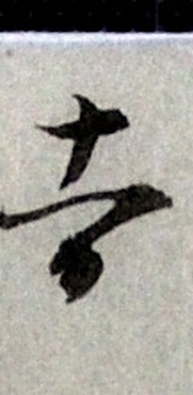十一日
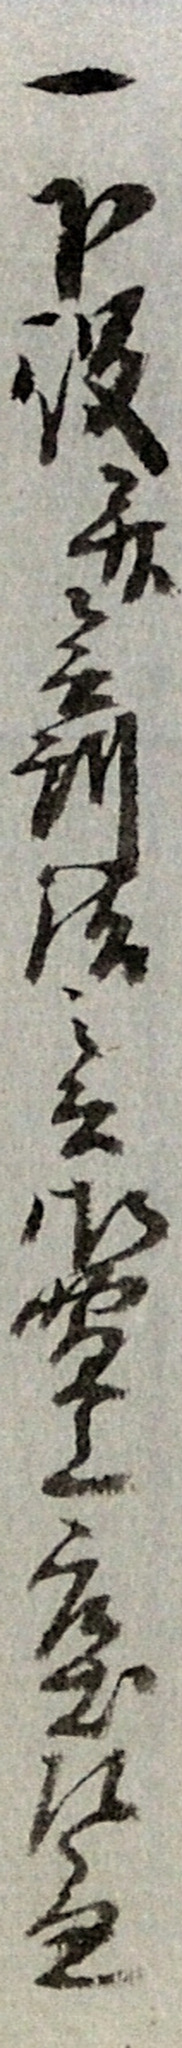一下役幷会所詰之者御買上差出左之通
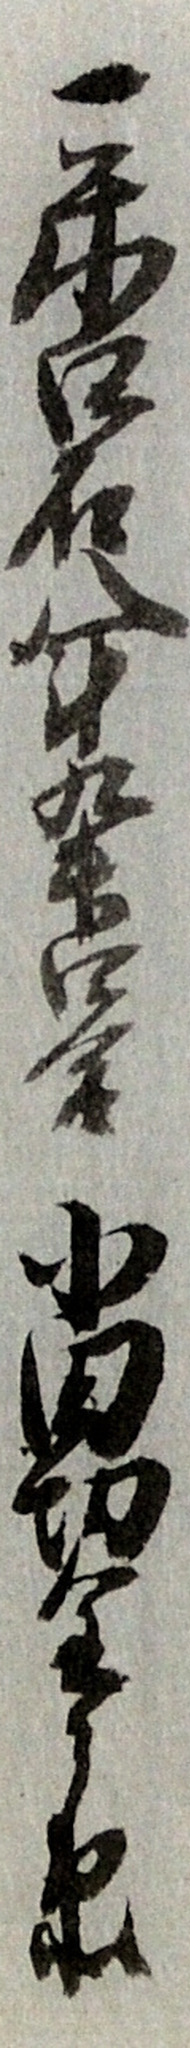一米四石八斗九升四合小田切金兵衛
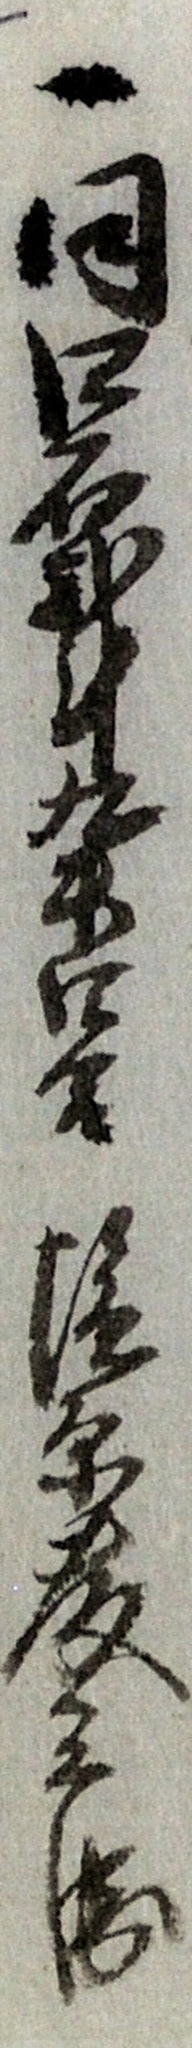一同四石弐斗九升四合塩原藤兵衛
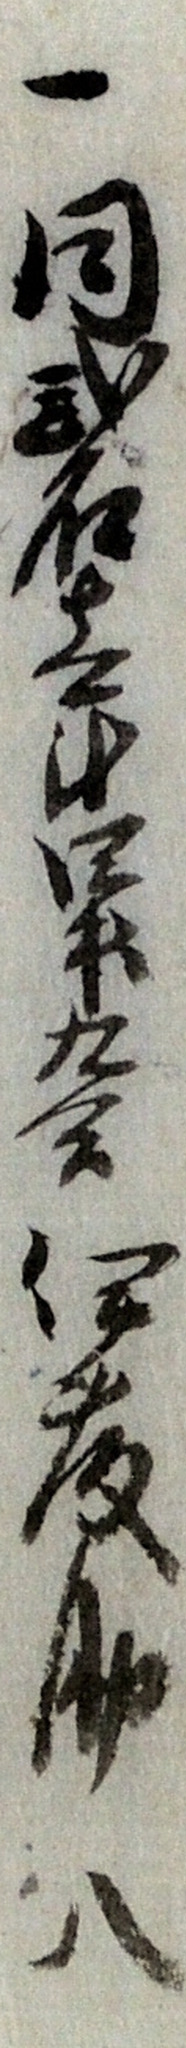一同弐石壱斗四升九合伊藤助八
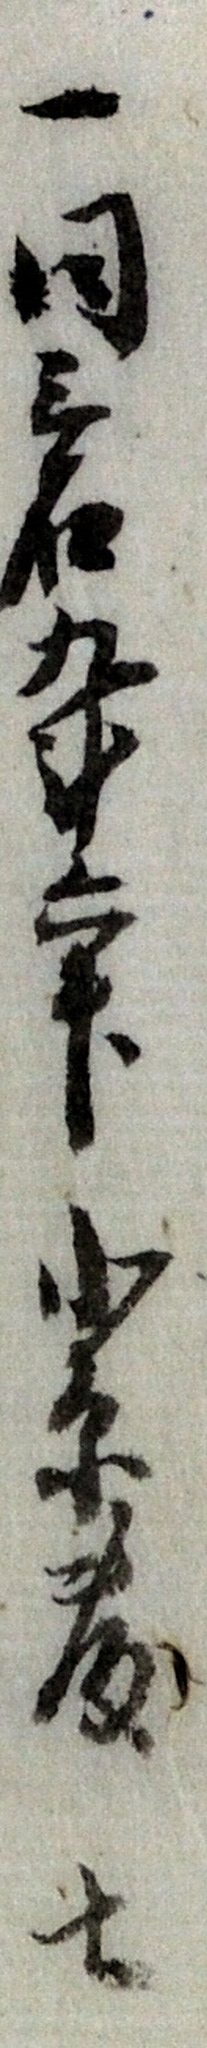一同三石九斗六升北原藤七
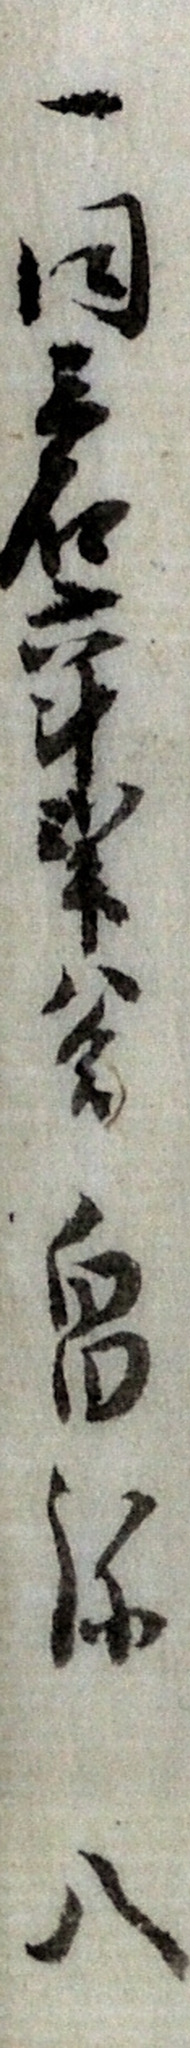一同三石六斗弐升八合畠弥八

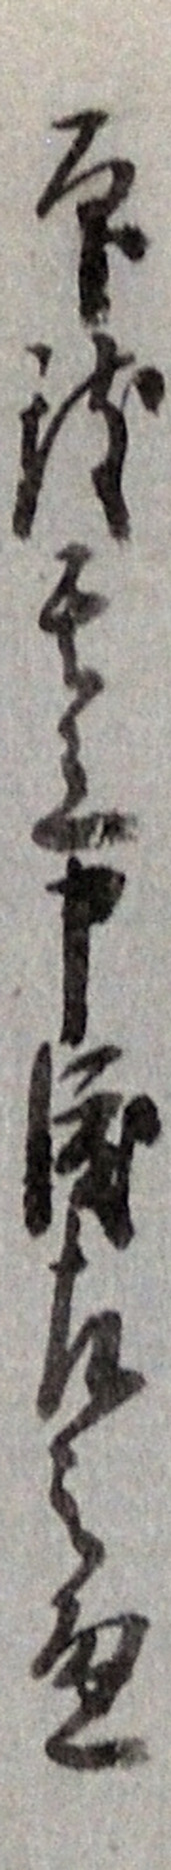印致其上申渡左之通
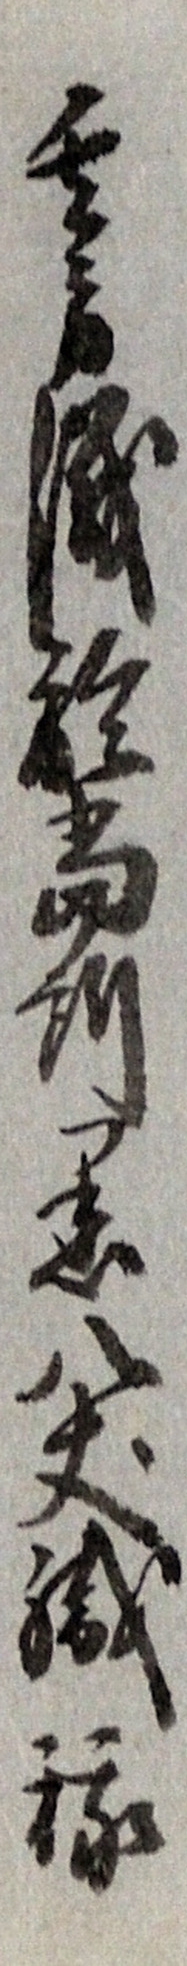其方儀於当所黒八丈織稼
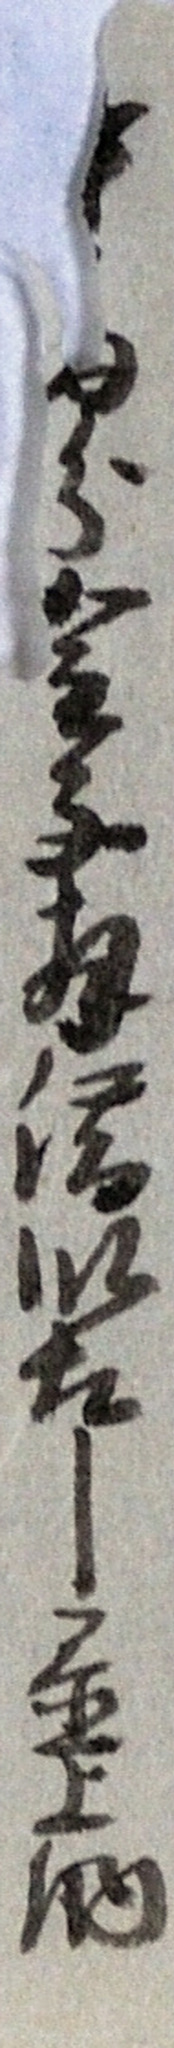当分金子拝借いたし置上納
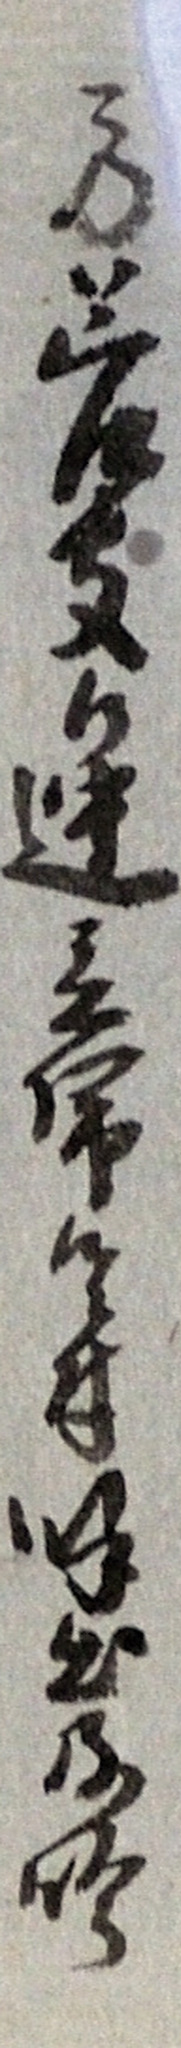方差支候迚立帰候ニ付呼出及吟
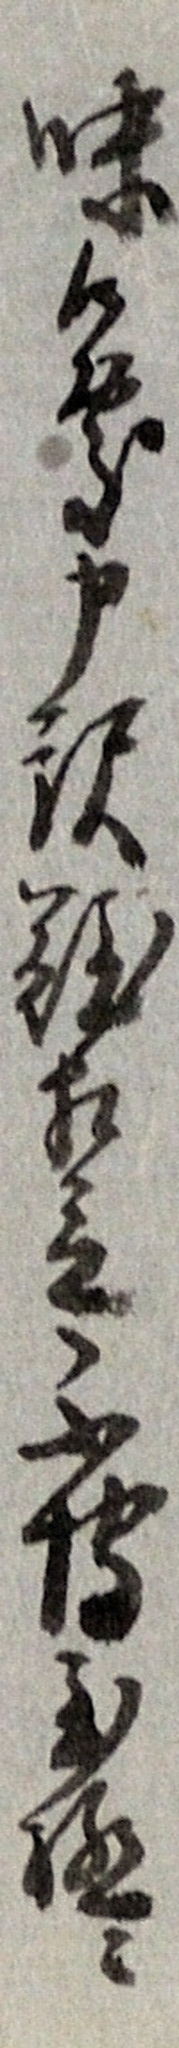味候処申訳難相立不埒至極ニ
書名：諸事御用留
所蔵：伊那市立高遠町図書館・合同会社AMANE
